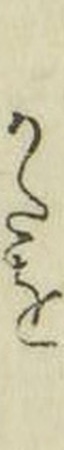かたを

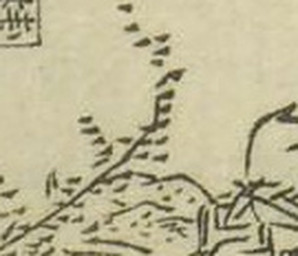十二月
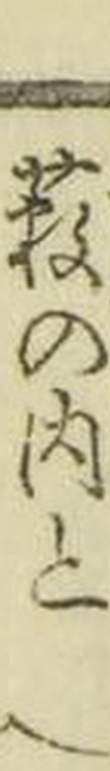藪の内と
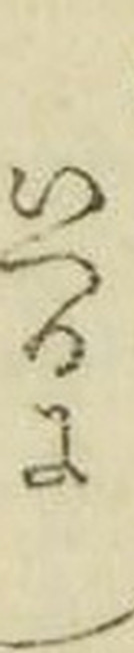いへるに
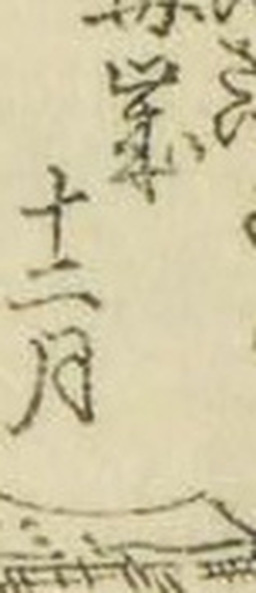十二月
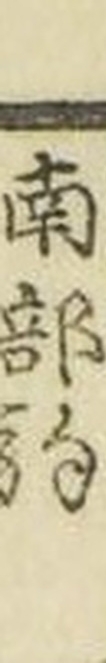南部駒
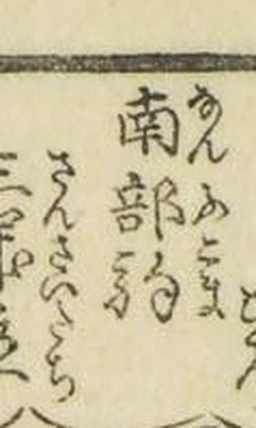南部駒
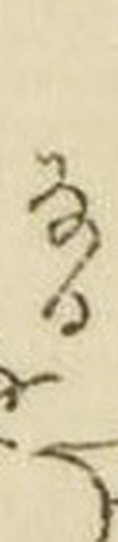なるを

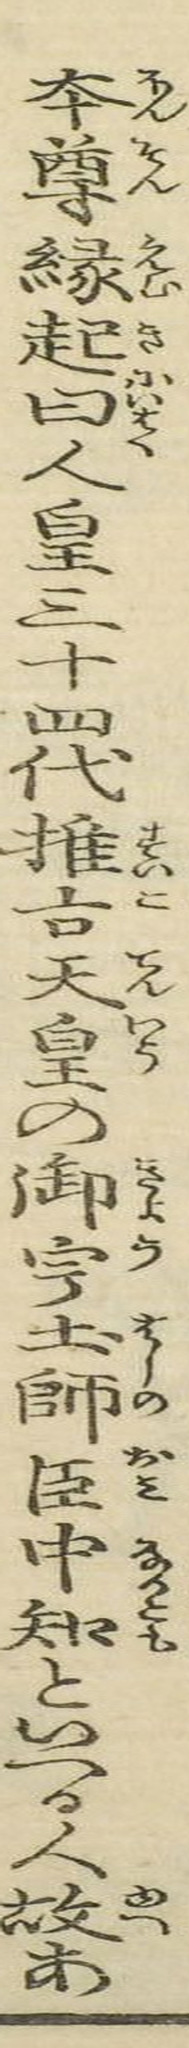本尊縁起曰人皇三十四代推古天皇の御宇土師臣中知といへる人故あ
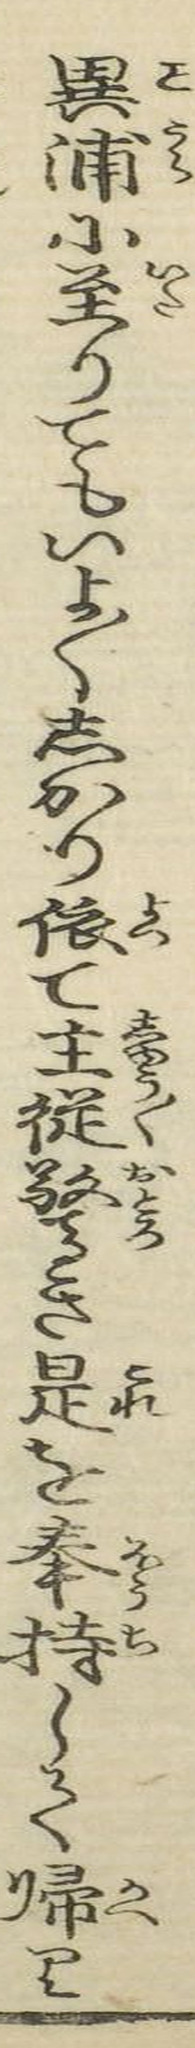異浦に至りてもいよ〳〵しかり依て主従驚き是を奉持して帰り
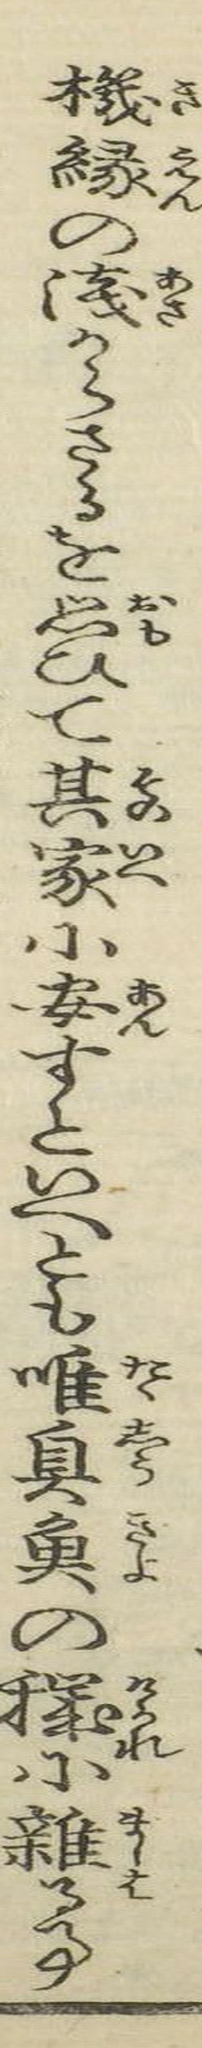機縁の浅からさるを思ひて其家に安すといへとも唯臭魚の穢に雑る事

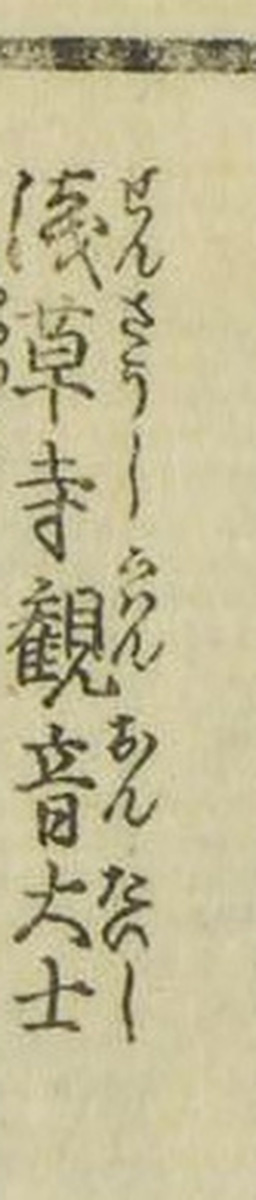浅草寺観音大士
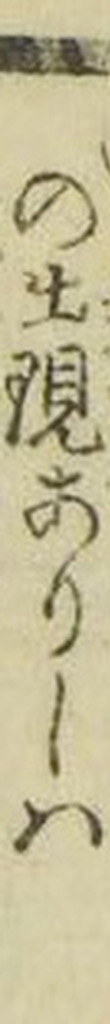の出現ありしは
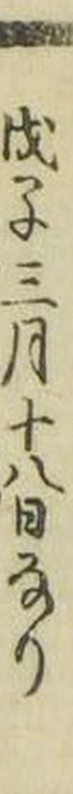戊子三月十八日なり
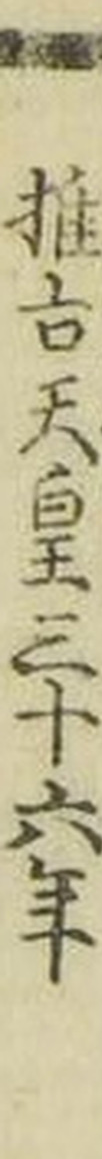推古天皇三十六年
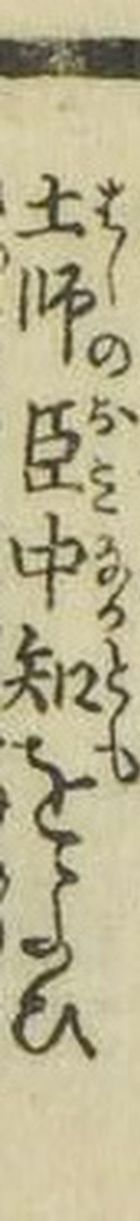土師臣中知をよひ
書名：江戸名所図会 20巻 巻之16
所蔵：東京学芸大学教育コンテンツアーカイブ
